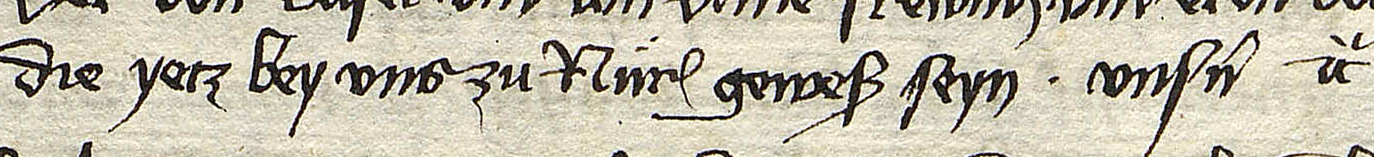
die yecʒ bey vns ʒu Nür* geweſ* ſeyn . vnſn* ec*
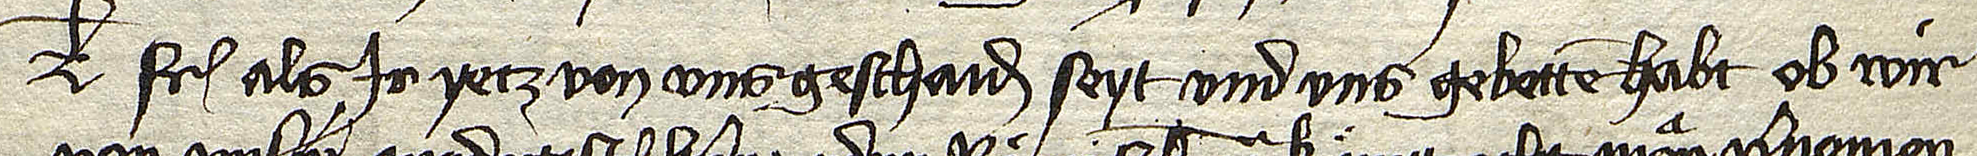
L* fr* als Ir yecʒ von vns geſchaid* ſeyt vnd vns gebette* habt ob wir
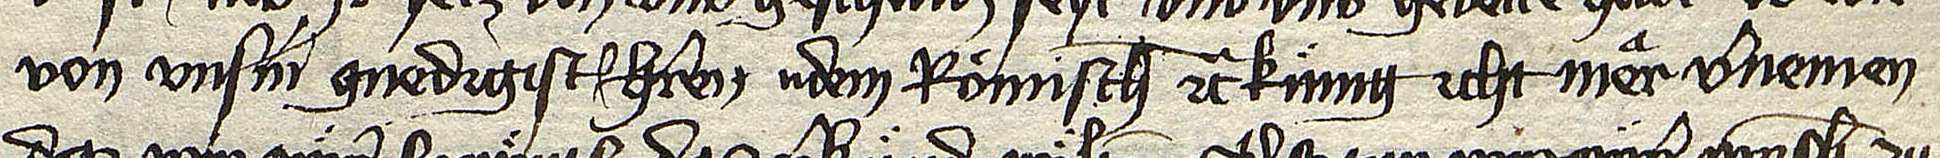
von vnſm* gnedigiſt* hr*en ~ dem Römiſch* ec* künig icht mër v*nemen
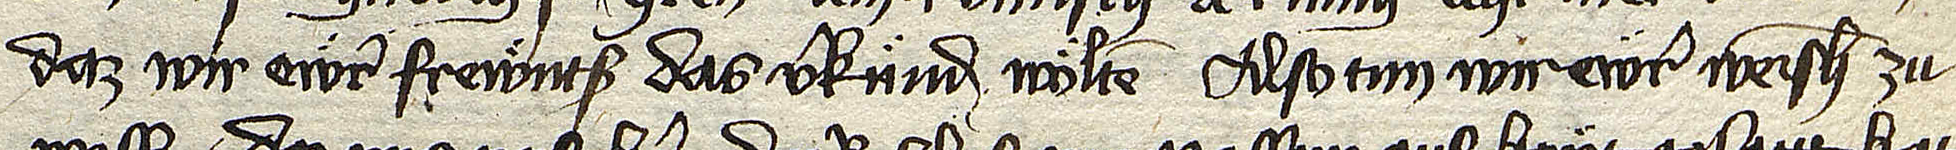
daʒ wir eẅr* freẅntſ* das v*künd* wölte* Alſo tun wir eẅr* weiſh* ʒu
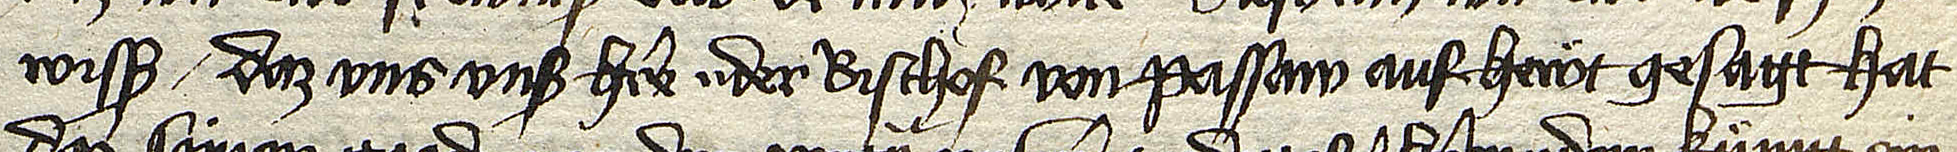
wiſſ* / daʒ vnd vnſ* hr*e ~ der Biſchof von Paſſaw auf heẅt geſagt hat
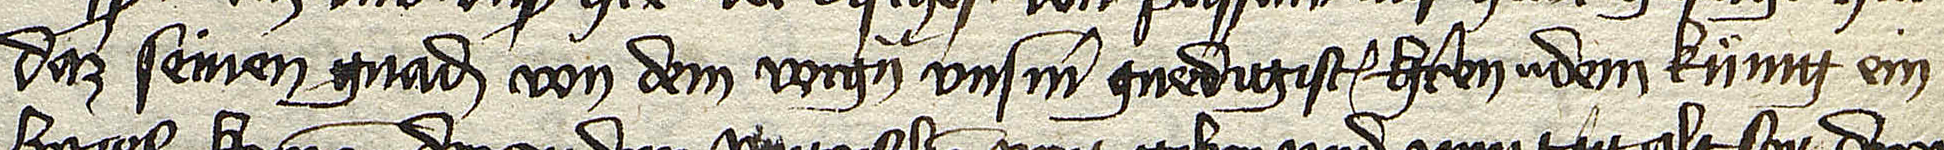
daʒ ſeinen gnad* von dem vorgn* vnſm* gnedigiſt* hr*en ~ dem künig ein
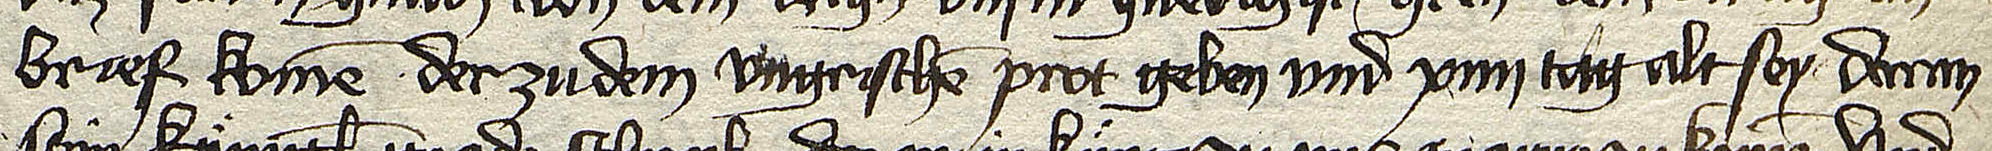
brief kome* der ʒu dem vngriſche* prot geben vnd xiiii tag alt ſey daran
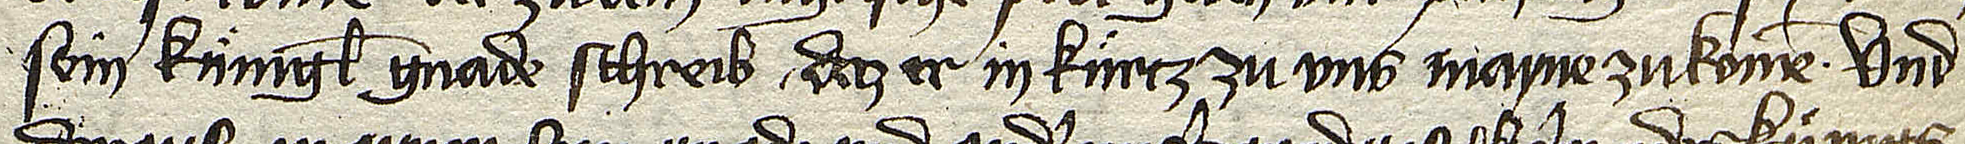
ſein künigl* gnade ſchreib / daʒ er in kürcʒ ʒu vns mayne ʒu kome* . Vnd
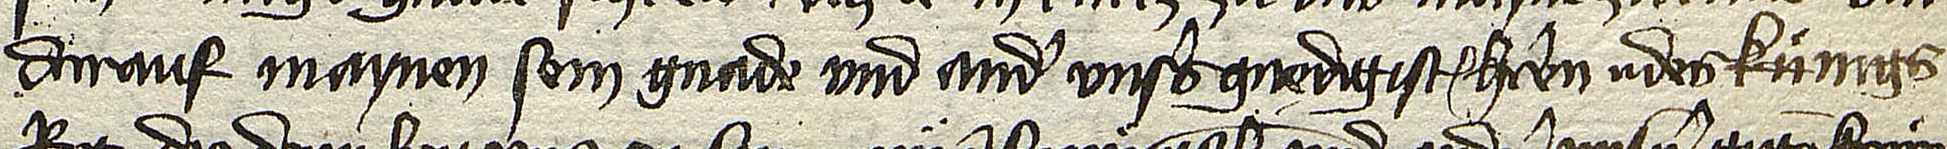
darauf maynen ſein gnade vnd and* vnſ*s gnedigiſt* hr*en ~ des künigs
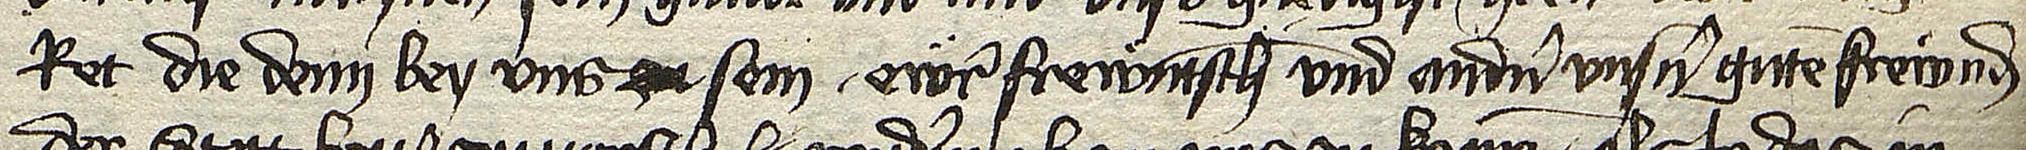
Ret die denn bey vns ʒu ſein / eẅr* freẅntſch* vnd andn* vnſn* gute* freẅnd*
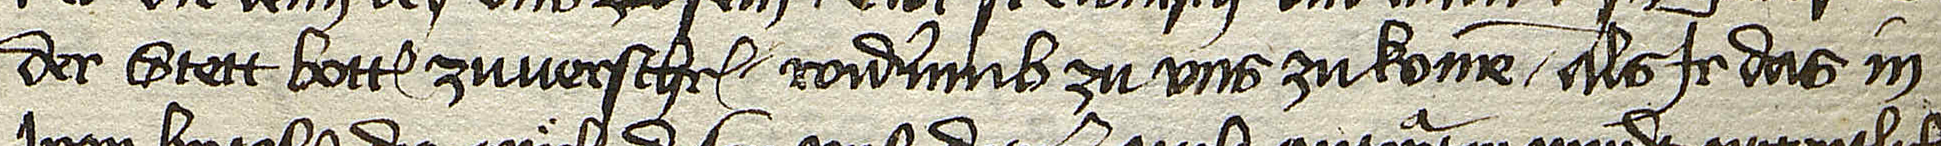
der Stett bott* ʒuuerſchr* / wid*umb ʒu vns ʒu kome* / als Ir das in
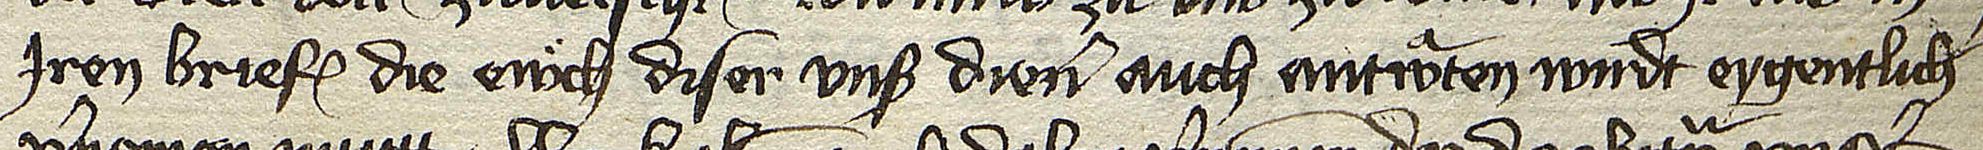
Iren brief* die eẅch diſer vnſ* dien* auch antwten* wirdt eygentlich*
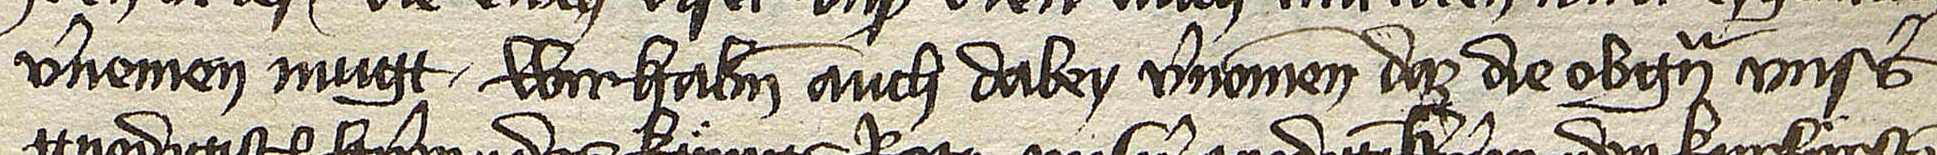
v*nemen mugt / wir habn* auch dabey v*nomen daʒ die obgn* vnſs*
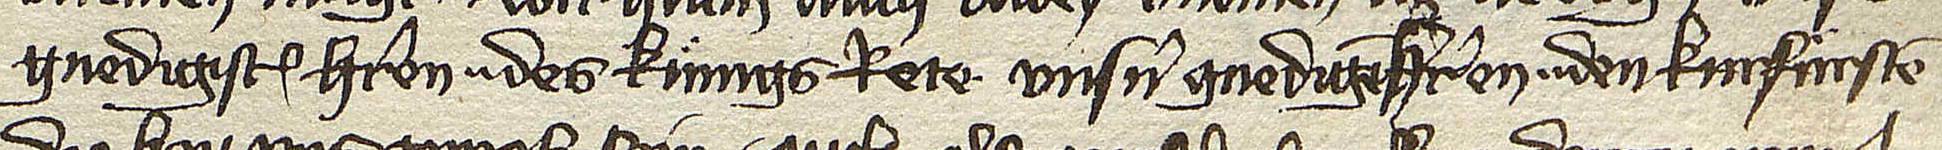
gnedigiſt* hr*en ~ des künigs Rete vnſn* gnedige* hr*en ~ den kurfürſte
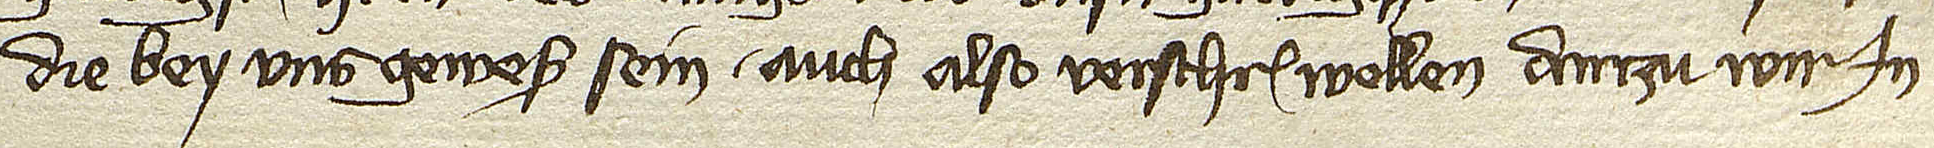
die bey vns geweſ* ſein / auch alſo verſchr* wellen darcʒu wir In
